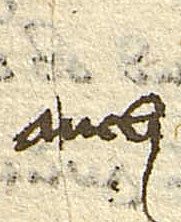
auch
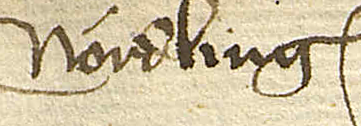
Nördling*
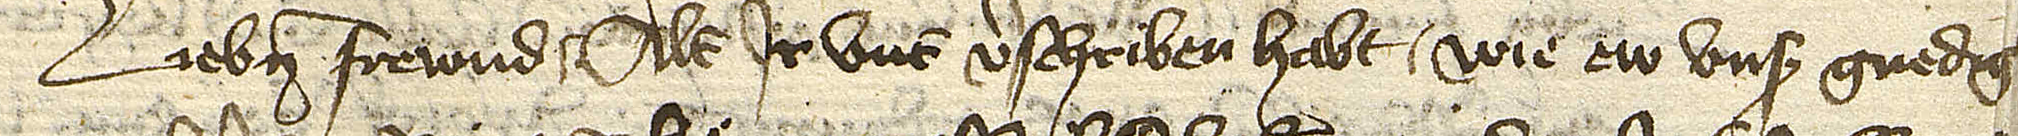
Liebn* frewnd / Als Ir vns v*ſchriben habt / wie ew vnſ* gnedig*
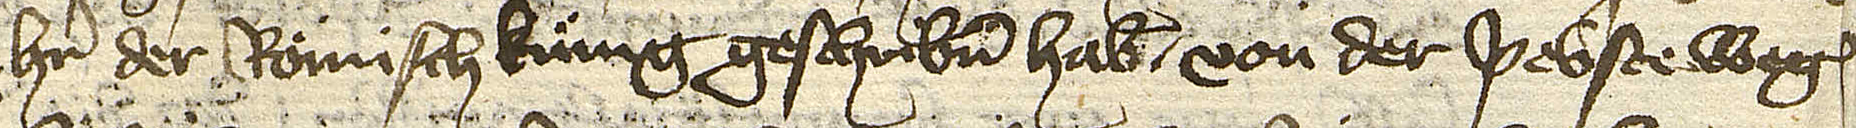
hr* der Römiſch künig geſchribn* hab / von der Pebſte weg*
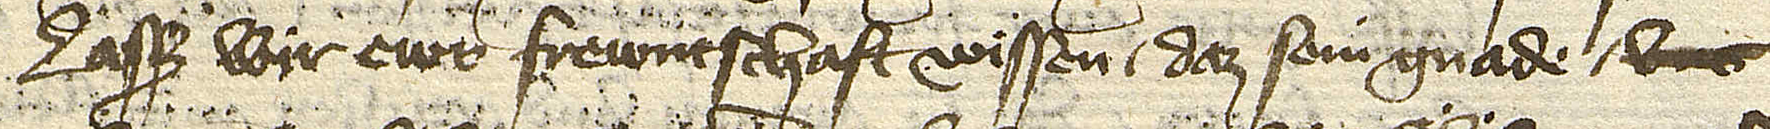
Laſſ* wir ewr frewntſchaft wiſſen / daʒ ſein gnade / vns
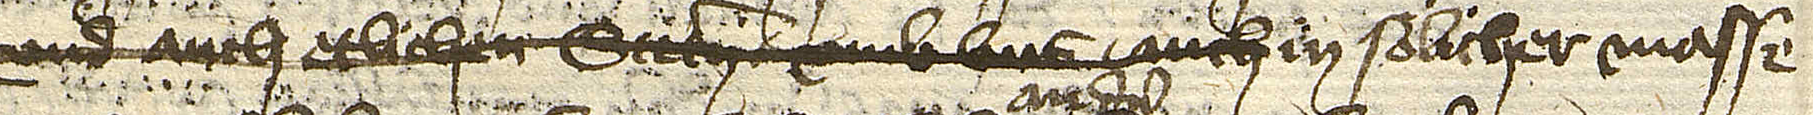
vnd auch etlichen Stetn* / vmb vns / auch in ſölicher maſſe
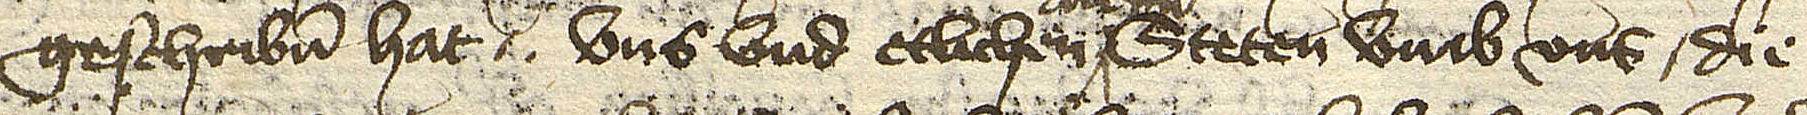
geſchribn* hat / . vns vnd etlichen Steten vmb vns / die
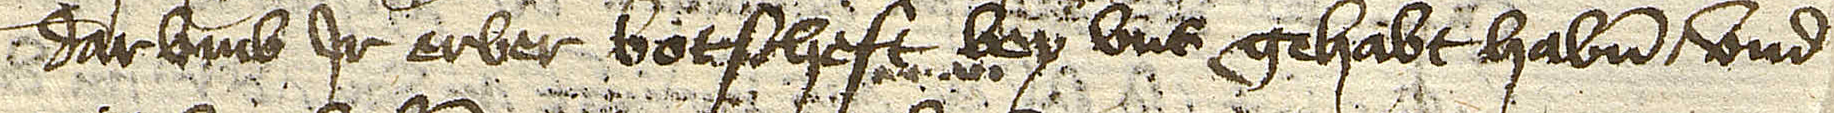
darvmb Ir erber botschaft bey vns gehabt habn* / vnd
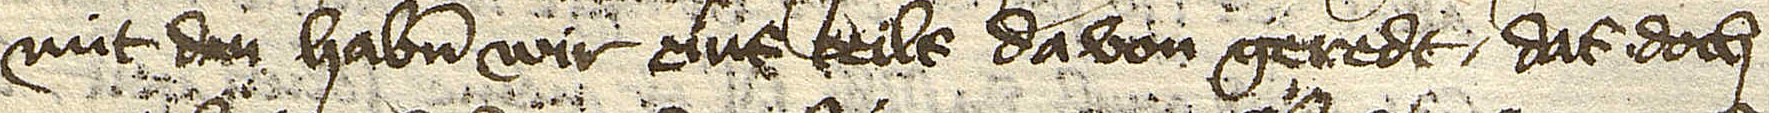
mit den habn* wir eins teils davon geredt / das doch
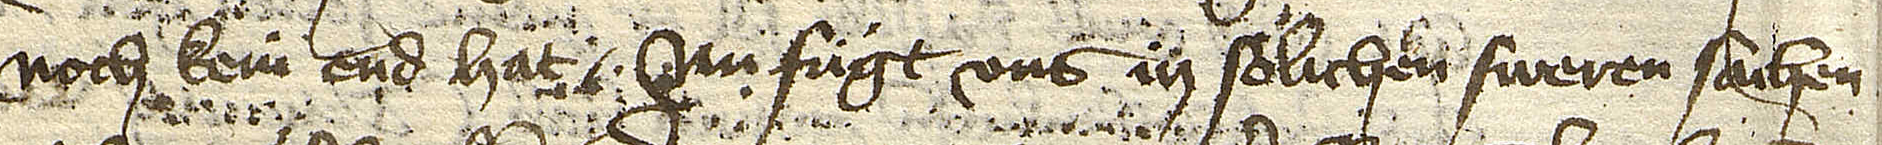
noch kein end hat / . Nu fügt vns in ſölichen ſweren ſachen
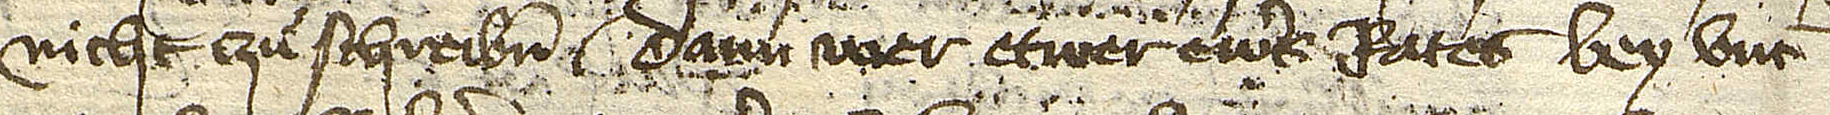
nicht cʒü ſchreibn* / Dann wer etwer ew*s Rates bey vns
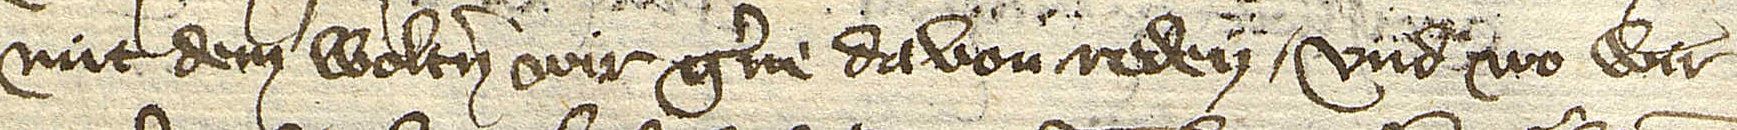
mit dem woltn* wir g*ne davon reden / vnd wo wir
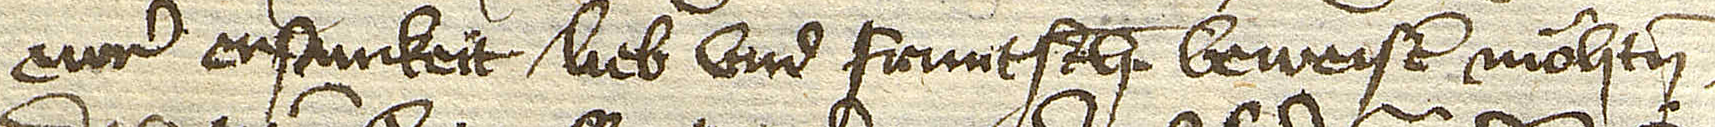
ewr* erſamkeit / lieb vnd fruntſch* beweiſe* möhtn* /
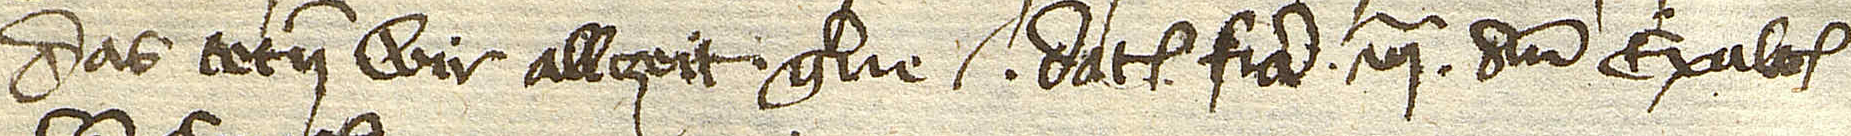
Das tetn* wir allcʒeit g*ne / . dat* fia* . vi . An* Exalt*
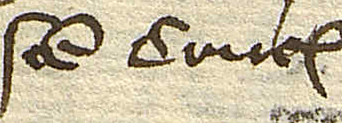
ſce* Cruc*
